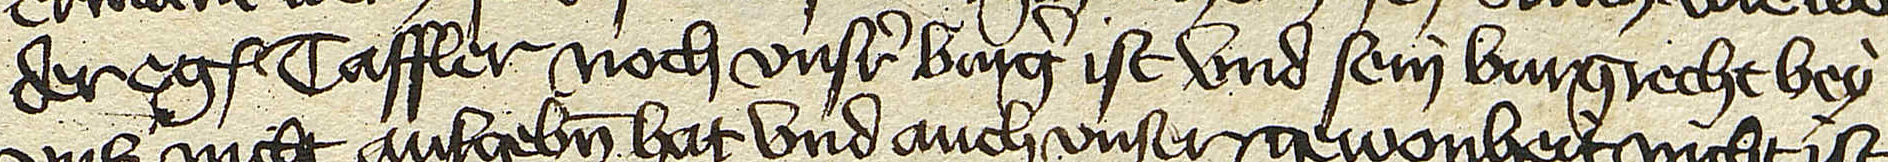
der eg* Taffler noch vnſr* burg* iſt vnd ſein burgrecht bey
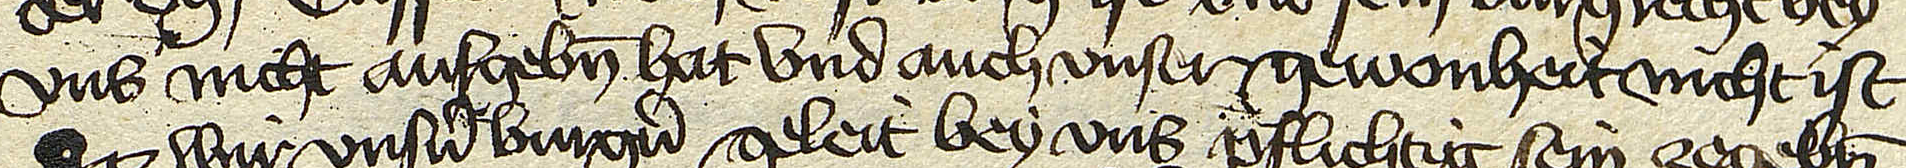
vns nicht aufgebn* hat vnd auch vnſer gewonheit nicht iſt
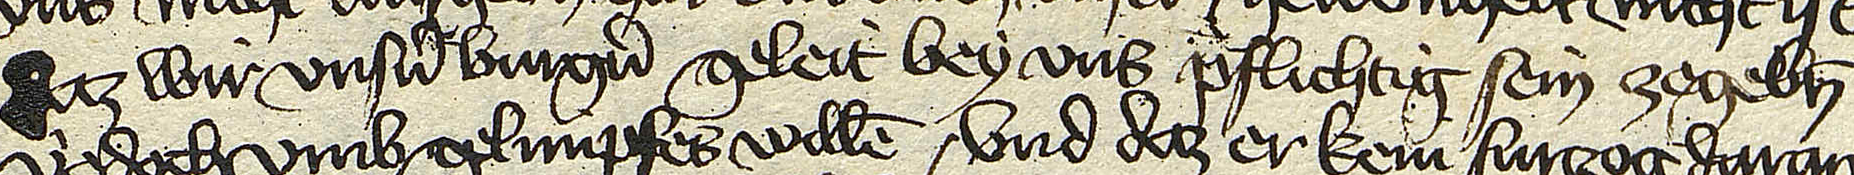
daʒ wir vnſn* burgn* geleit bey vns pflichtig ſein cʒegebn*
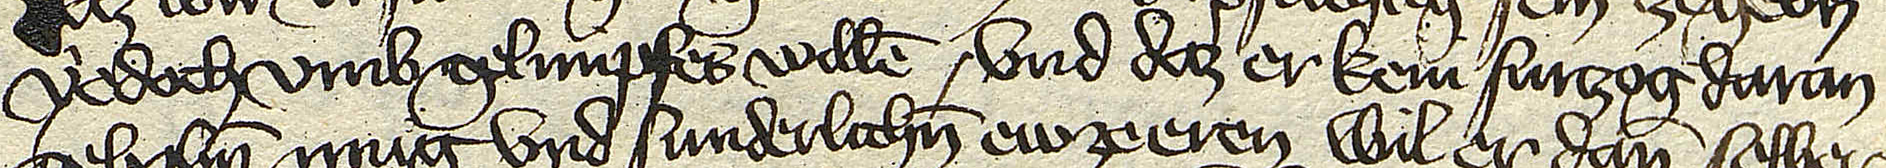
yedoch vmb gelimpfes wille* / vnd daʒ er kein furcʒog daran
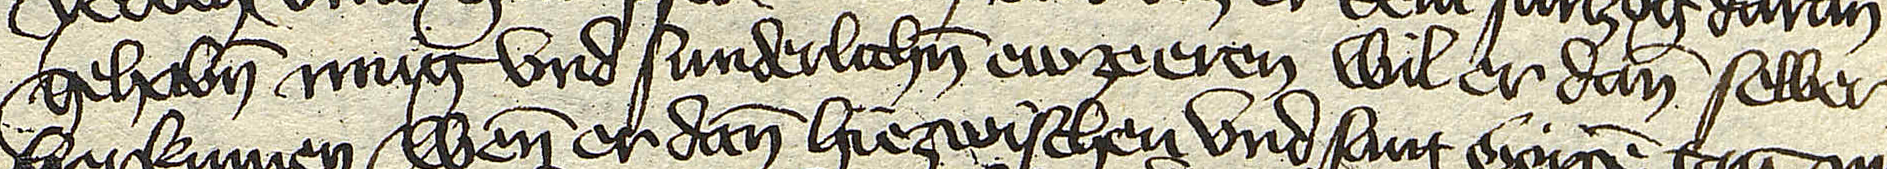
gehabn* mg vnd ſunderlichn* ew cʒeeren wil er dan* ſelber
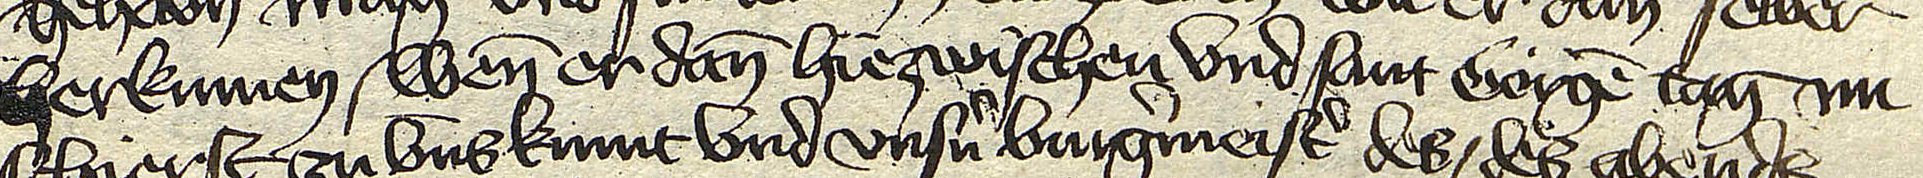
herkumen / wen* er dan* hiecʒwiſchen vnd ſant Görge tag nu
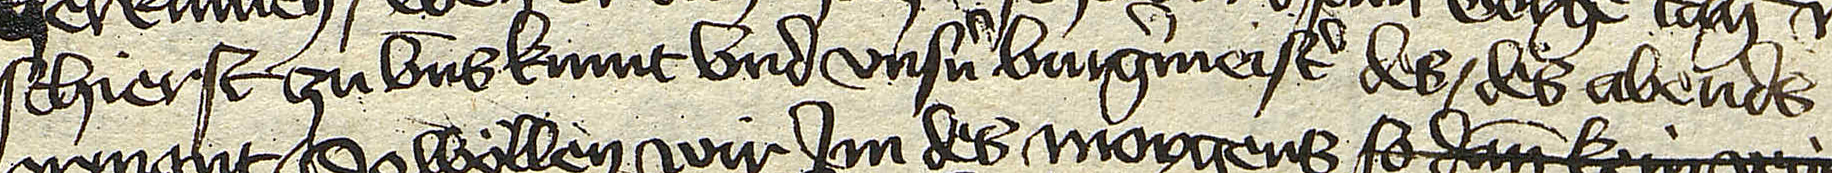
ſchierſt cʒu vns kumt vnd vnſn* burg*meiſt* des / des abends
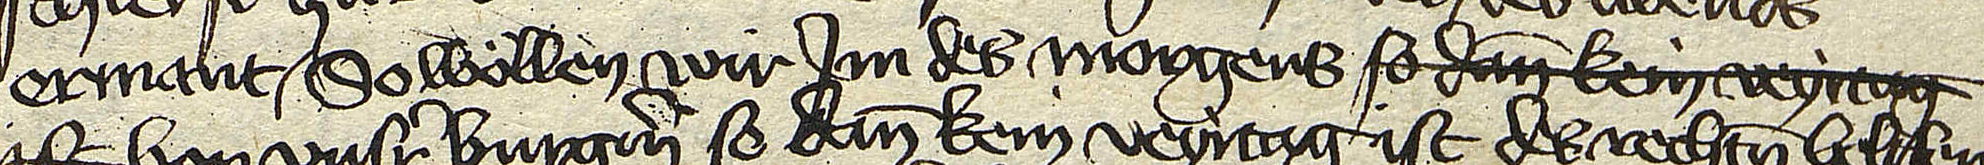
ermant / So wöllen wir Im des morgens ſo dan* kein veyrtag
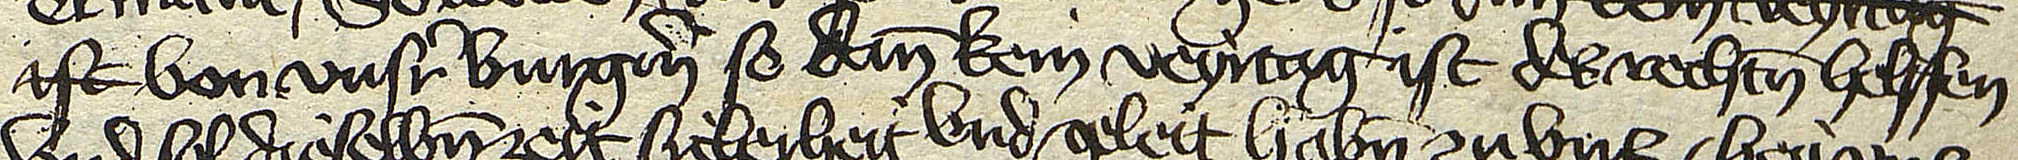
iſt von vnſr* burg*in ſo dan* kein veyrtag iſt des rechtn* helffen
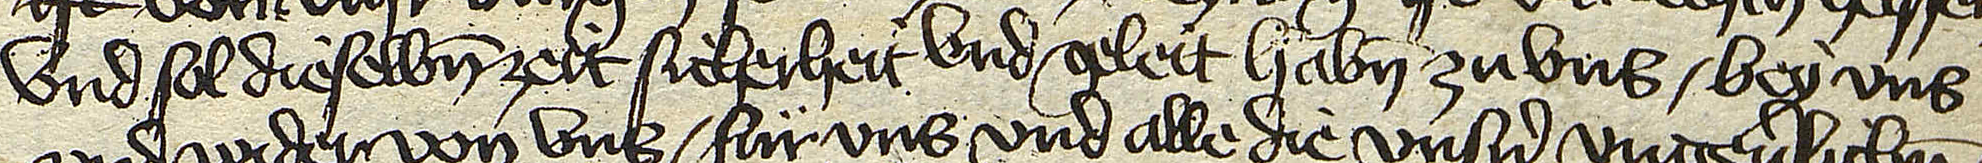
vnd ſol dieſelbn* cʒeit ſicherheit vnd geleit habn* cʒu vns / bey vns
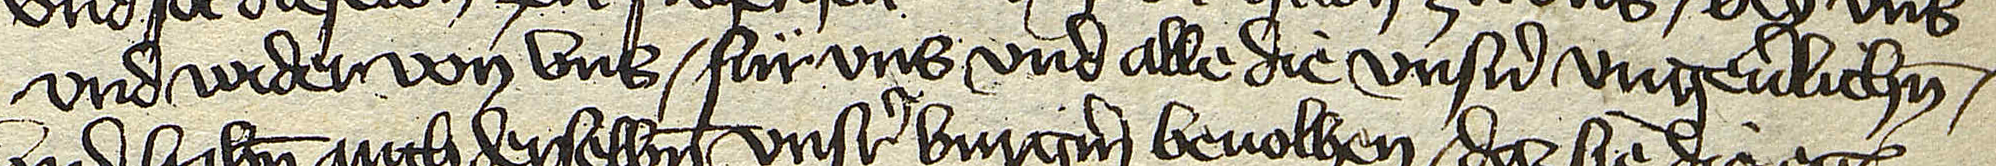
vnd wider von vns / für vns vnd alle die vnſn* vngeu*lichn* /
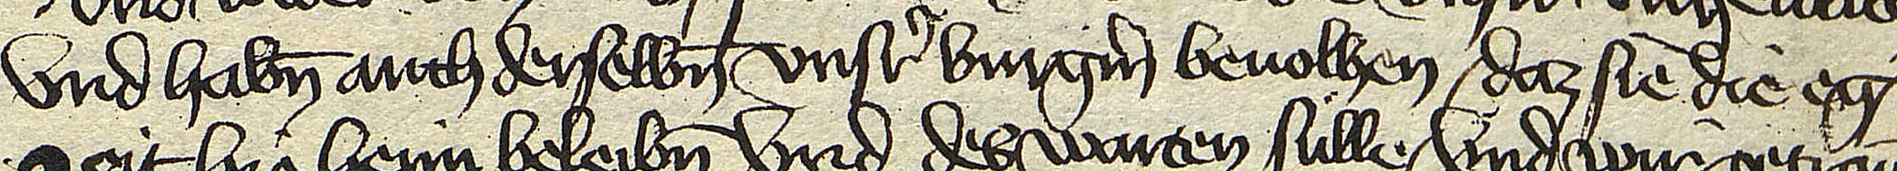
vnd habn* auch derſelbn* vnſr* burg*in beuolhen / daʒ ſie die eg*
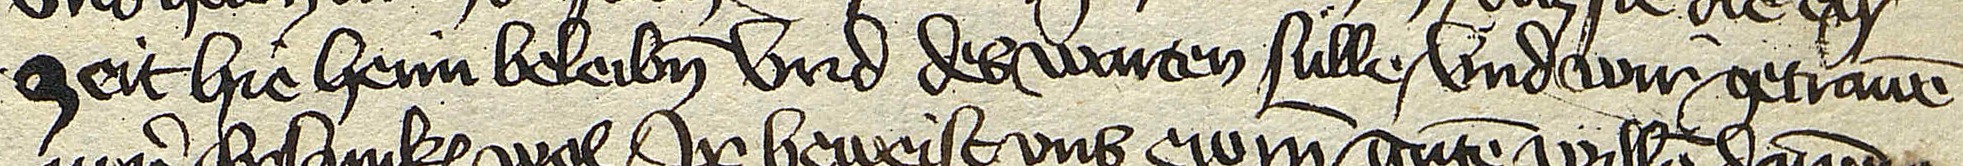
cʒeit hie heim beleibn* vnd des warten ſülle / vnd wir getrawe*
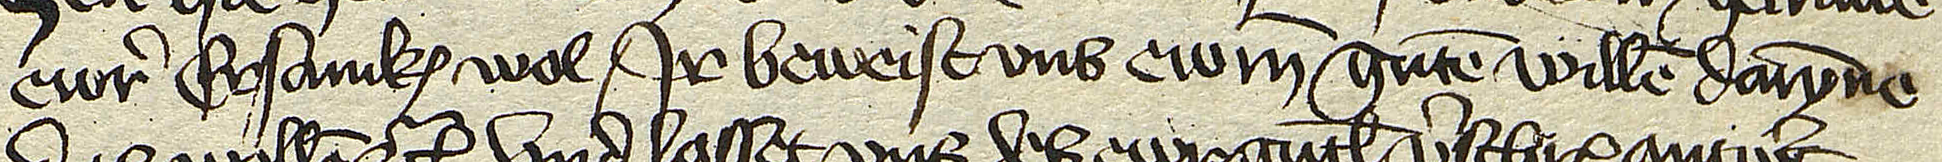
ewr* Erſamk* wol / Ir beweiſt vns ewrn* gute* wille* daryne*
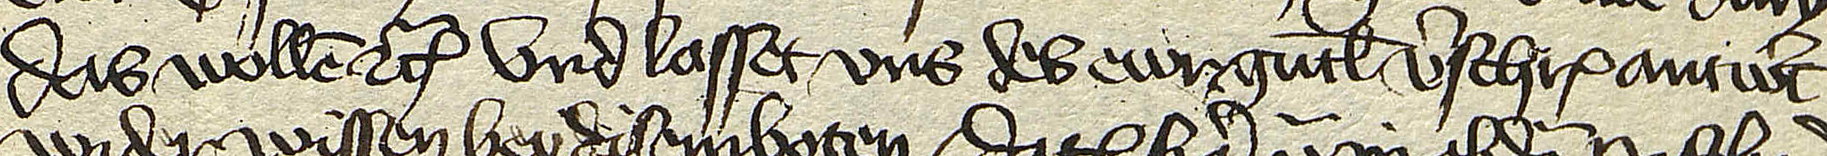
das wolle* ec* vnd laſſet vns des ewr gutl* v*ſchr* antwt*
